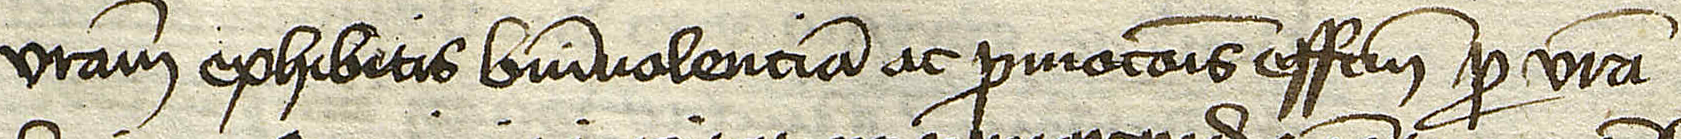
v*ram exhibetis b*niuolencia* ac p*moc*o*is eff*c*m p* v*ra
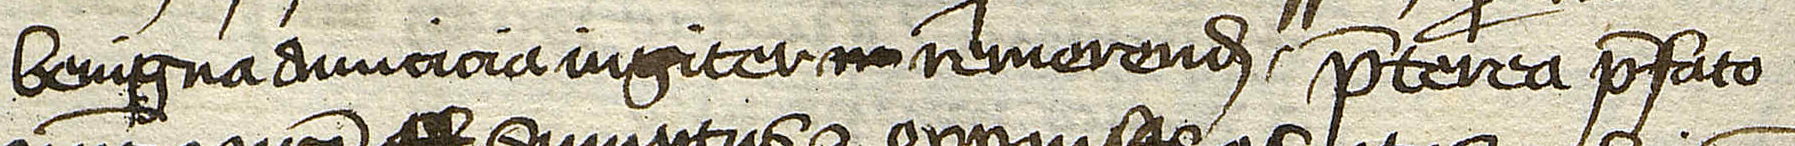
benigna Amicicia iugiter n remerend* / P*terea p*fato
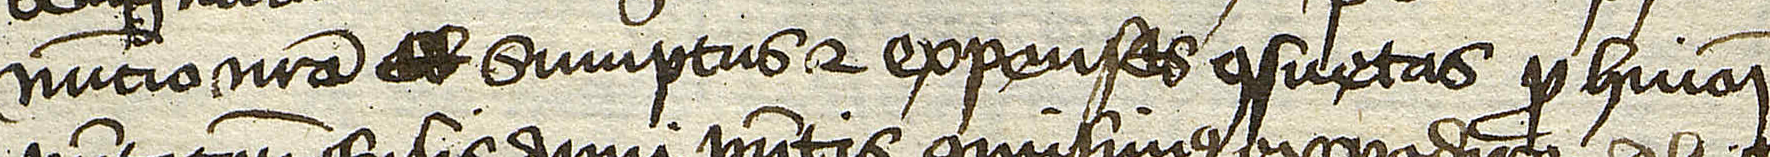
nu*cio n*ro El Sumptus @ expenſas *ſuetas P* hui*o*i
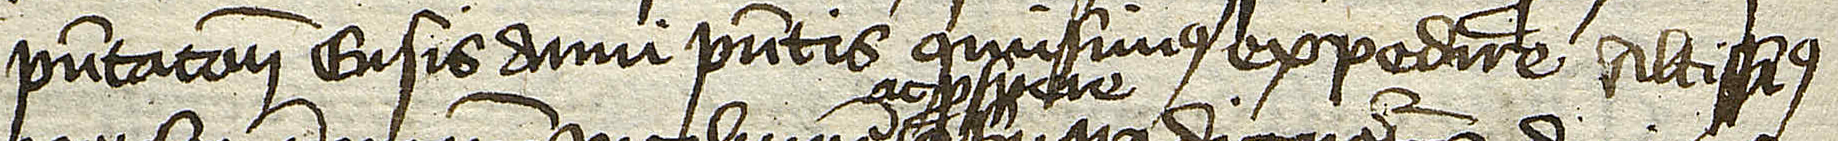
p*ntat*o*m Enſis Anni p*ntis *miſim* expedire Altiſſi*
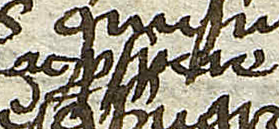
ac p*ſpere
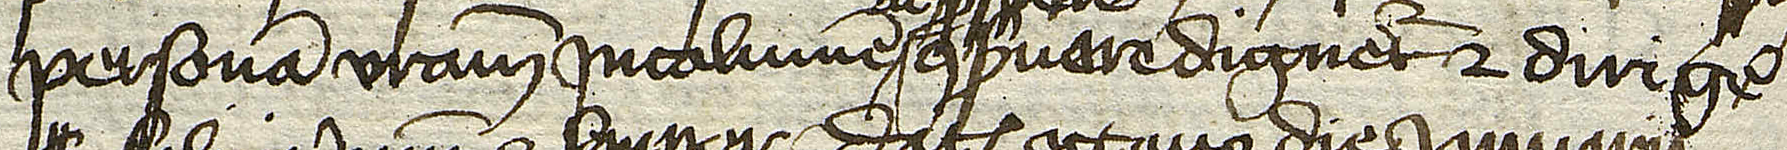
perſona* v*ram Incolume* *ſ*uare dignet* @ dirige*
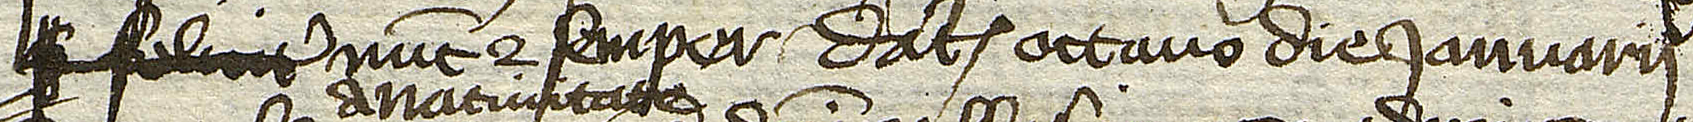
ſ felicit* nu*c @ ſemper / Dat* octauo die Ianuarii
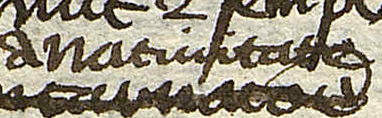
A Natiuitate
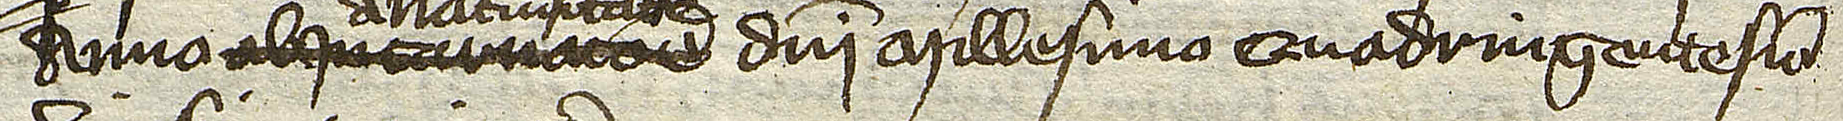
Anno ab Incarnacoe* d*ni Milleſimo Quadringenteſi*o
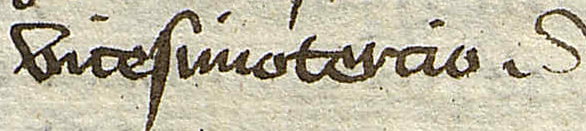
viceſimo tercio ec*
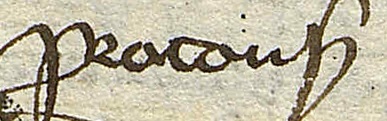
Proconſ*
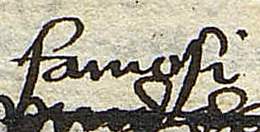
famoſi
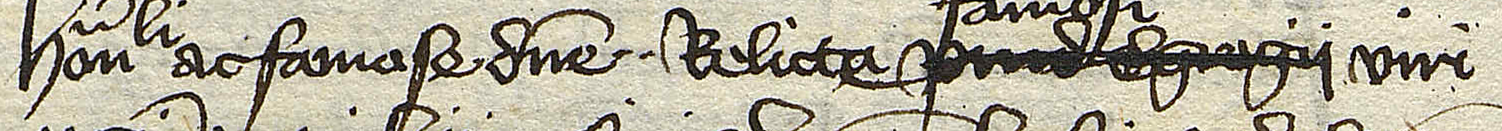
Hon* ac famoſe d*ne . Relicta pr%d egregii viri
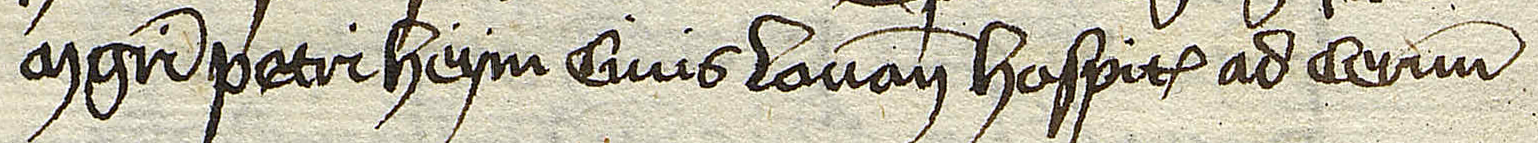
M*g*ri Petri Heym Ciuis Louan* hoſpitis ad Ceruu*
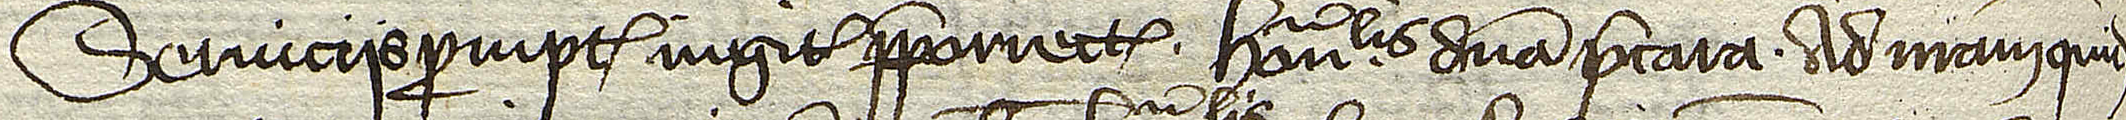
Seruiciis p*mpt* iugit* p*ponent* . Hon* d*na p*cara . Ad n*ram quid
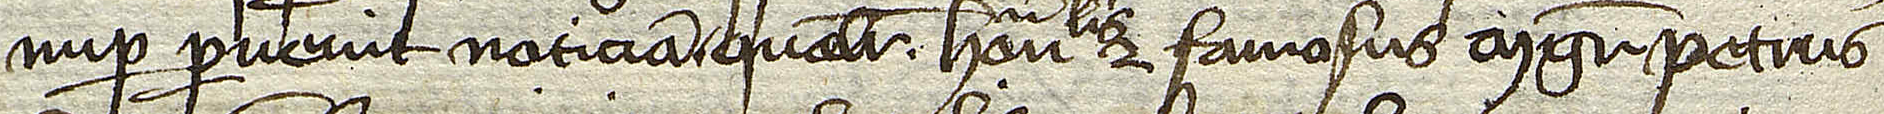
nup* p*uenit noticia* / qual*r . Hon* @ famoſus M*g*r Petrus
